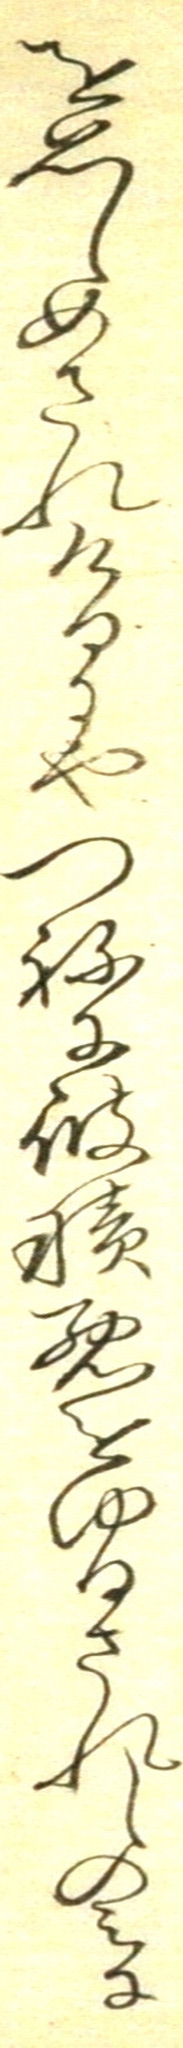を思しめされけるにやつねに彼積悪をゆるされしのみに
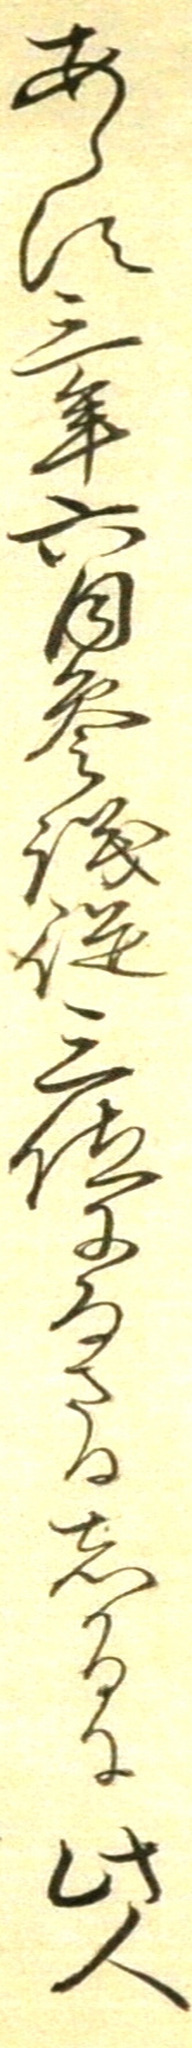あらす三年ろ六月参議従三位になさるしかるに此人
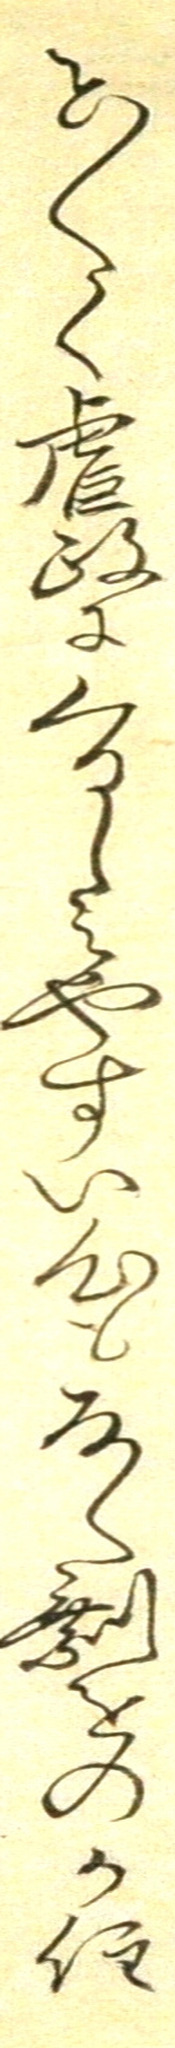と〳〵く虐政にくるしみやすい心もなく剰をのか住
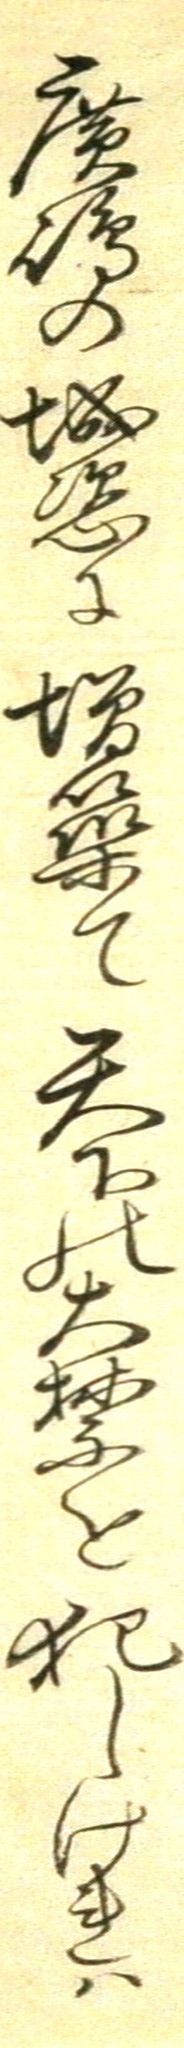広嶋の城恣に増築て天下の大禁を犯しけれは
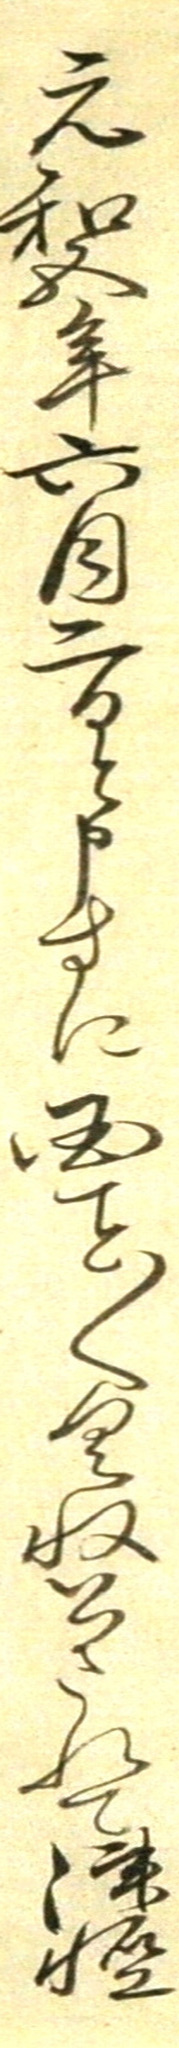元和五年六月二日と申すに国こと〳〵く収公されて津軽
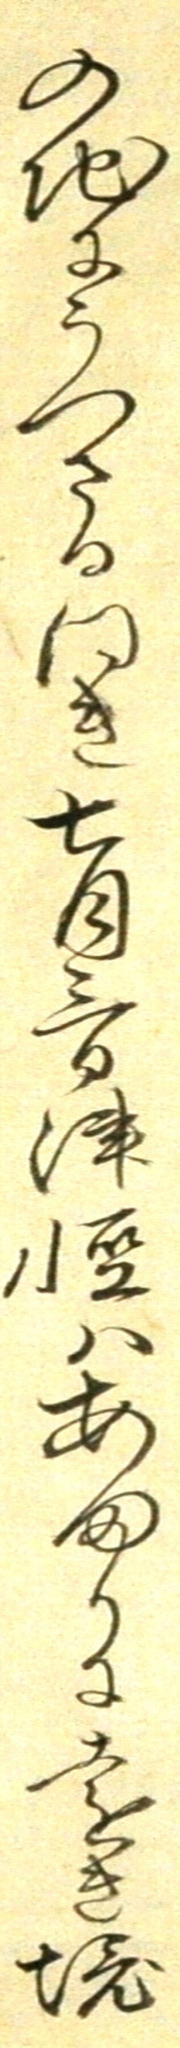の地にうつさる同き七月三日津軽はあまりに遠き境
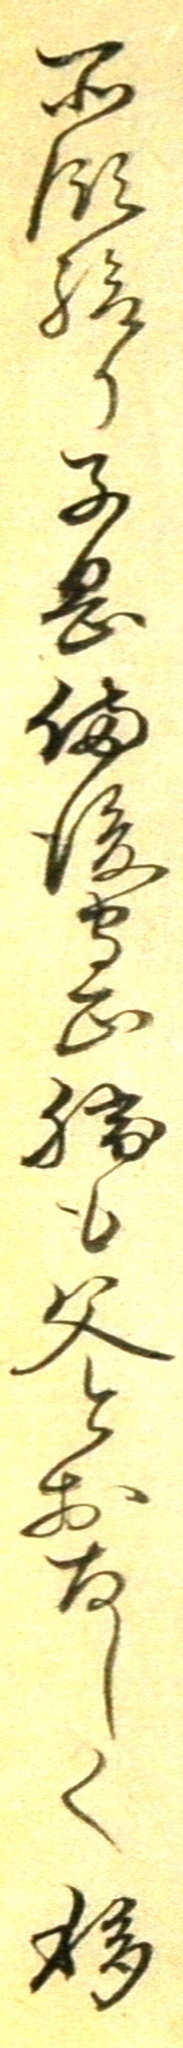所領給り子息備後守正勝も父とおなしく移

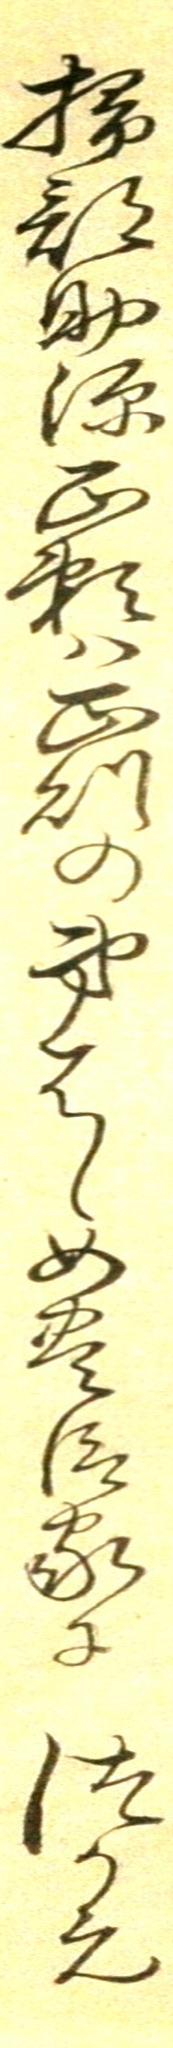掃部助源正頼は正則の弟はしめ豊臣家につかえ
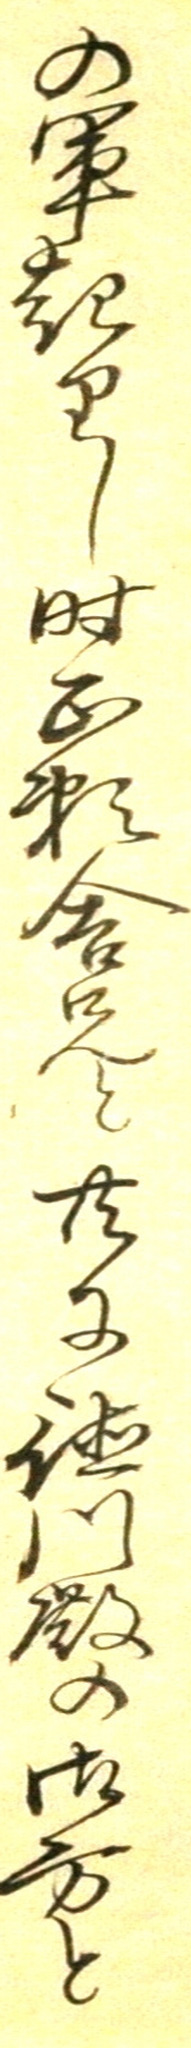の軍勢起りし時正頼舎兄と共に徳川殿の御方と
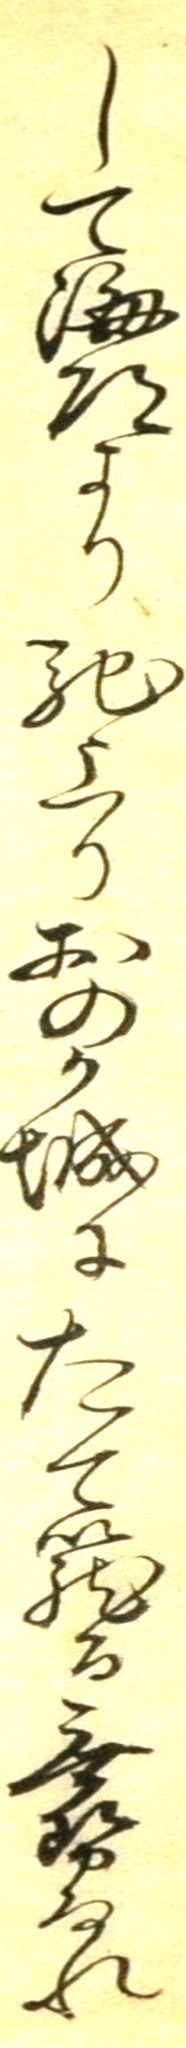して海道より馳上りおのか城にたて籠る無勢なれ
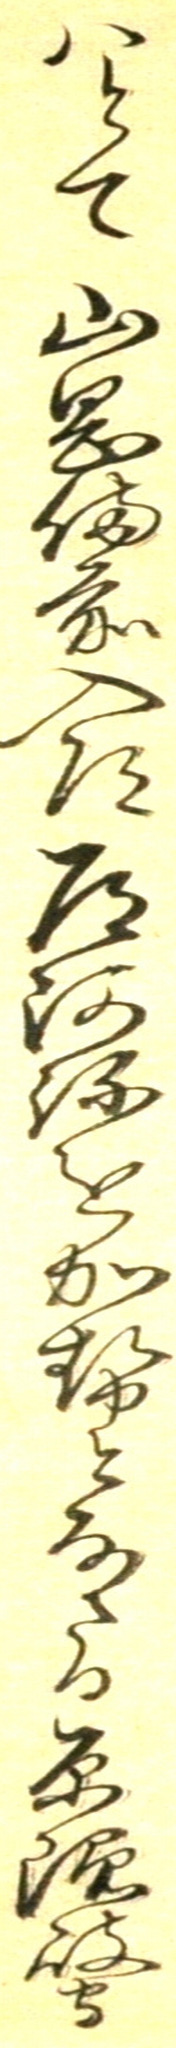はとて山岡備前入道道河弥加勢となさる原隠岐守
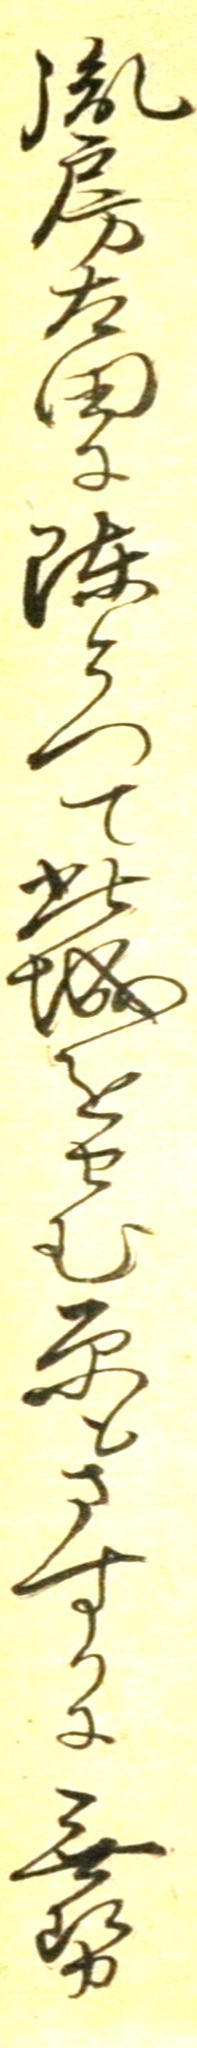胤房太田に陣とつて此城をせむ原もさすかに無勢
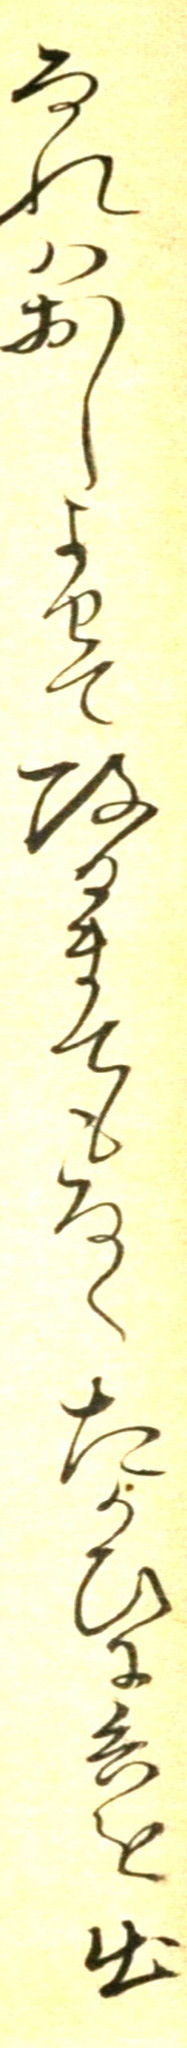なれはおしよせて攻るまてもなくたかひに兵を出
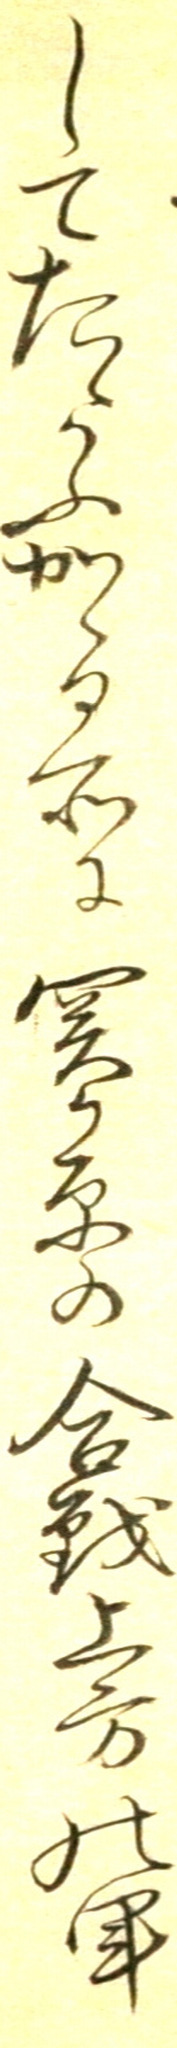してたゝかふかゝる所に関か原の合戦上方の軍
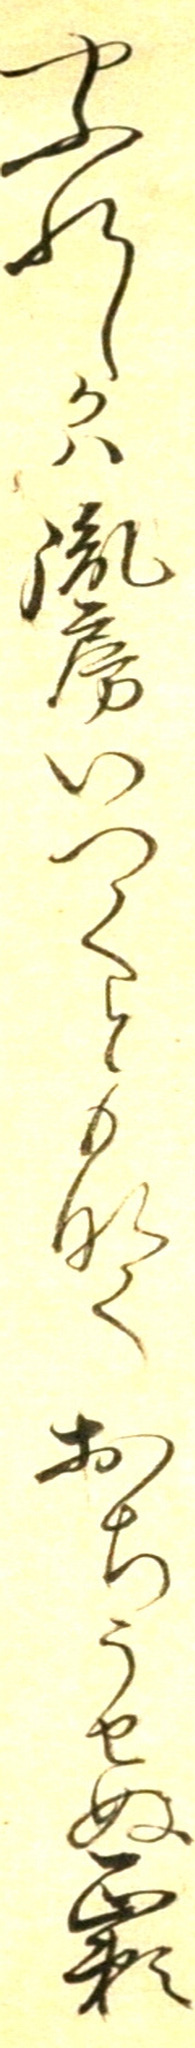やふれしかは胤房いつくともなくおちうせぬ正頼
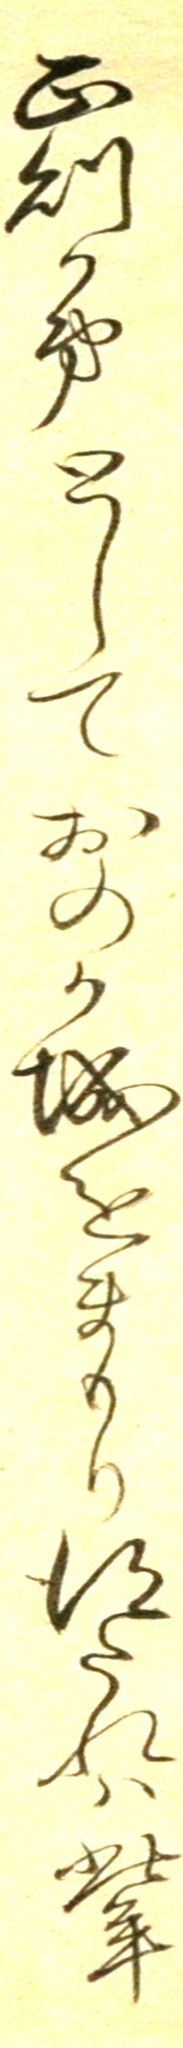正則か弟としておのか城をまもり得たれは此年
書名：藩翰譜（十二・上）
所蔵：伊那市立高遠町図書館・合同会社AMANE
